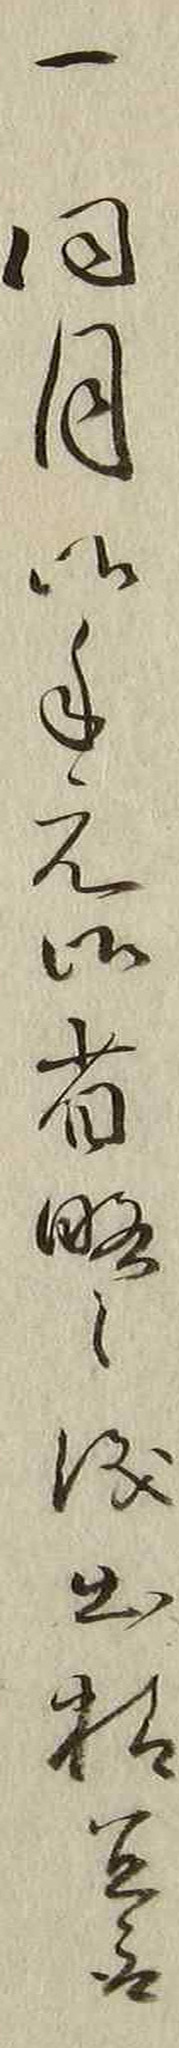一同月御手元御省略之儀出精宜取
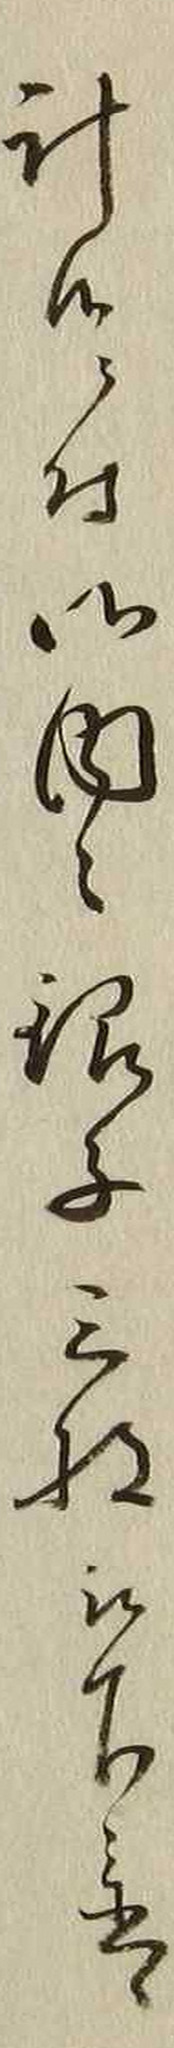計候ニ付御内々銀子三枚被下置候
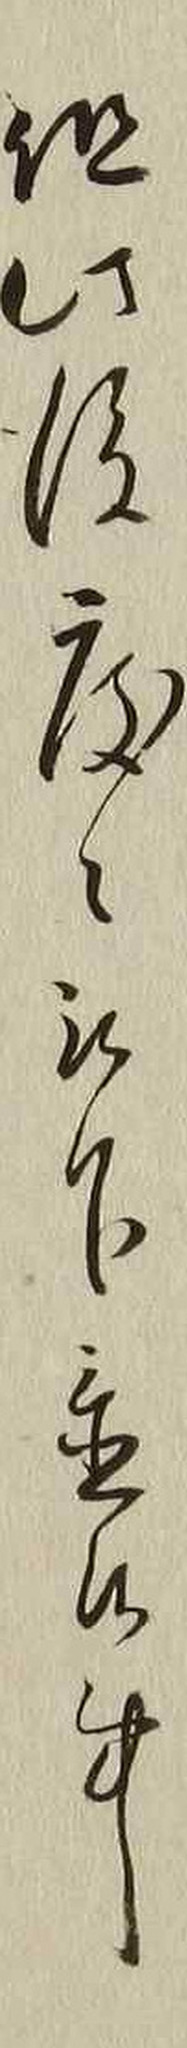但此後度々被下置候事
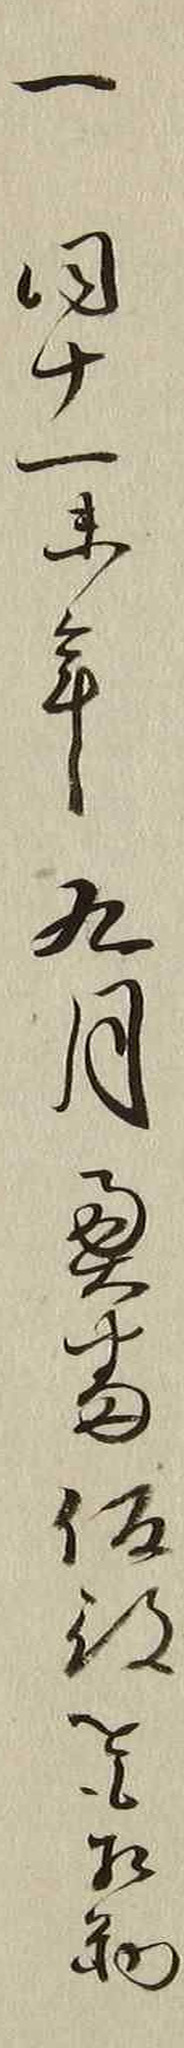一同十一未年九月奥番仮役をも相勤
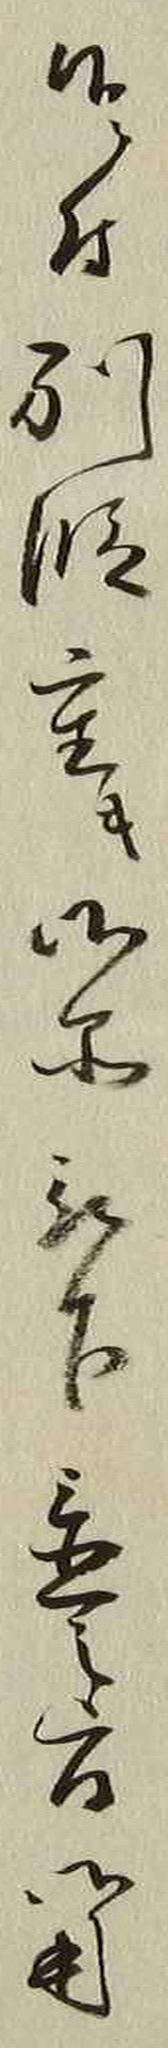候ニ付別段重キ御品被下置之旨御用
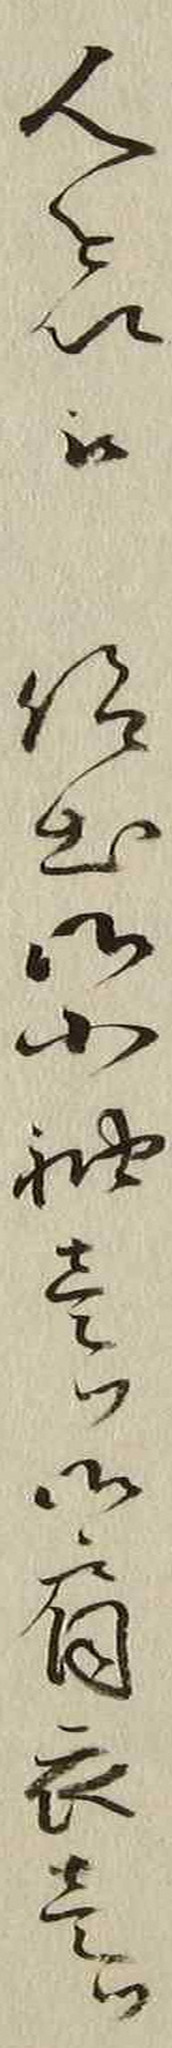人を以被仰出御小袖壱ツ御肩衣壱ツ
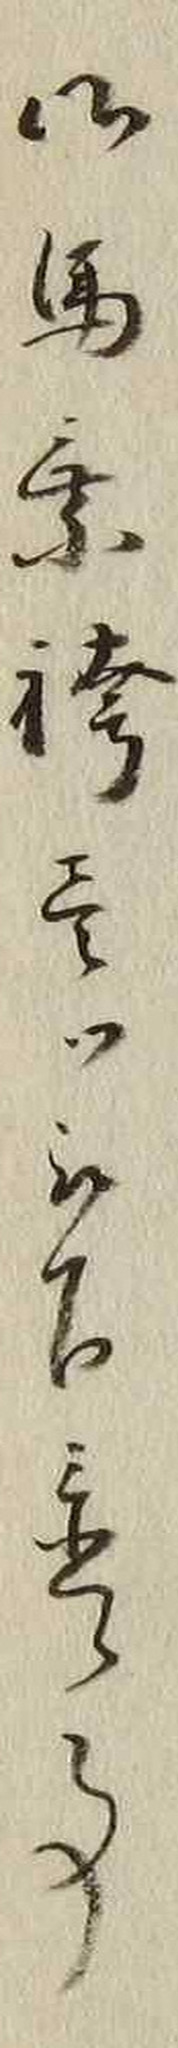御馬乗袴壱ツ被下置候事
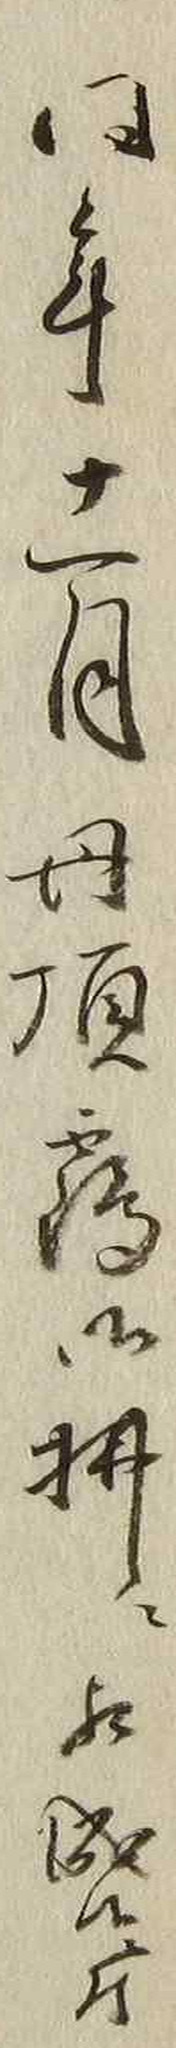一同年十一月丹頂鶴御払ニ相成候ニ付
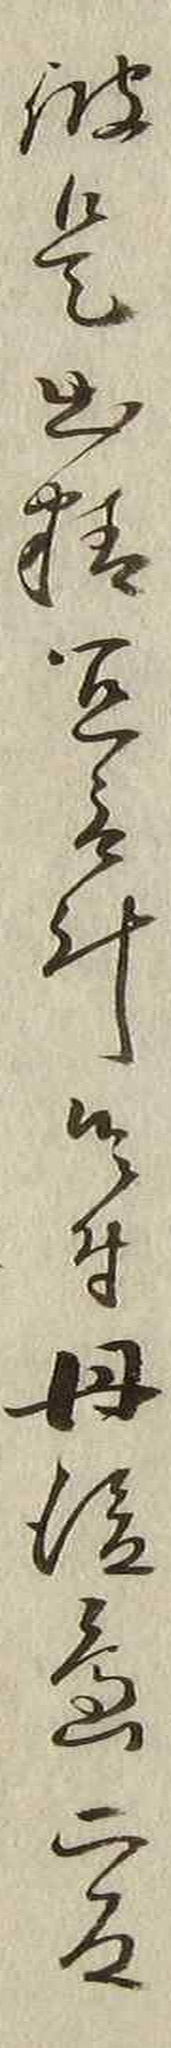彼是出精宜取計候ニ付丹後嶋二反
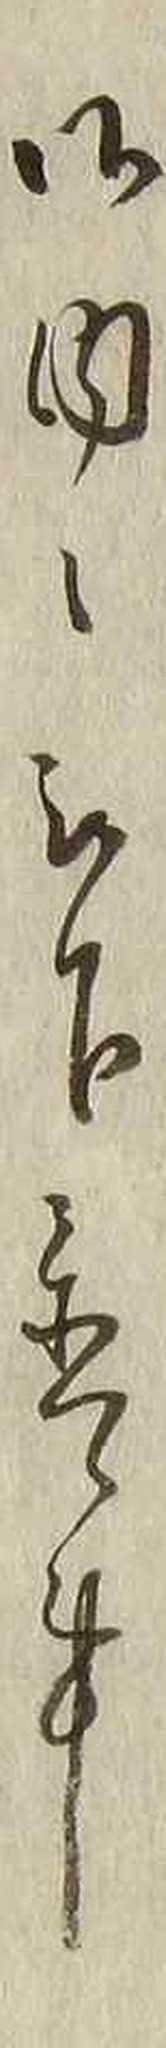御内々被下置候事
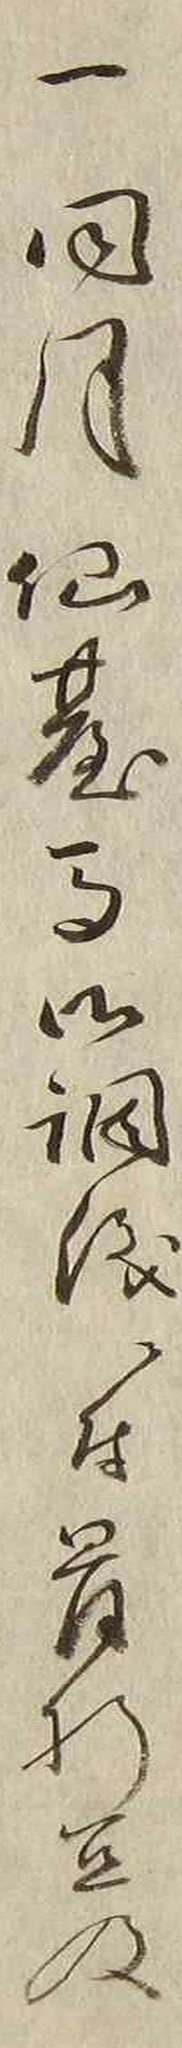一同月仙台馬御調儀ニ付骨折宜及
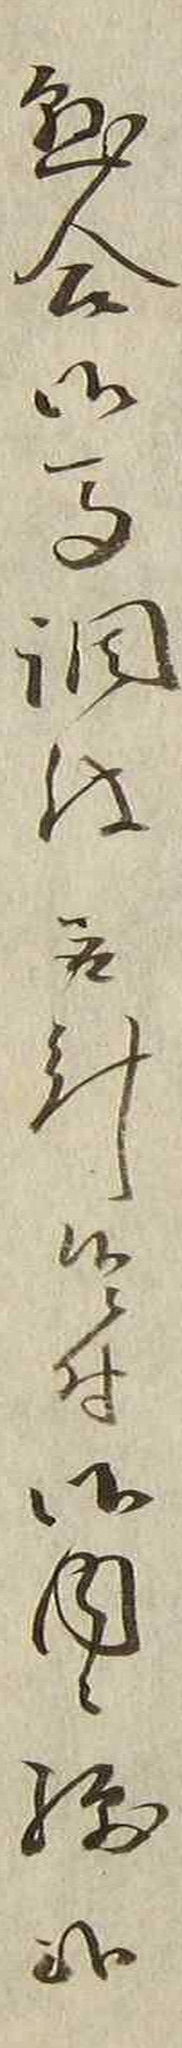懸合御馬調儀取計候ニ付御内々綿弐
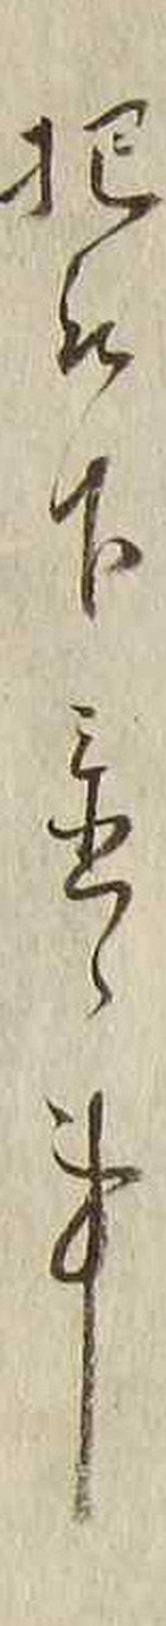被下置候事
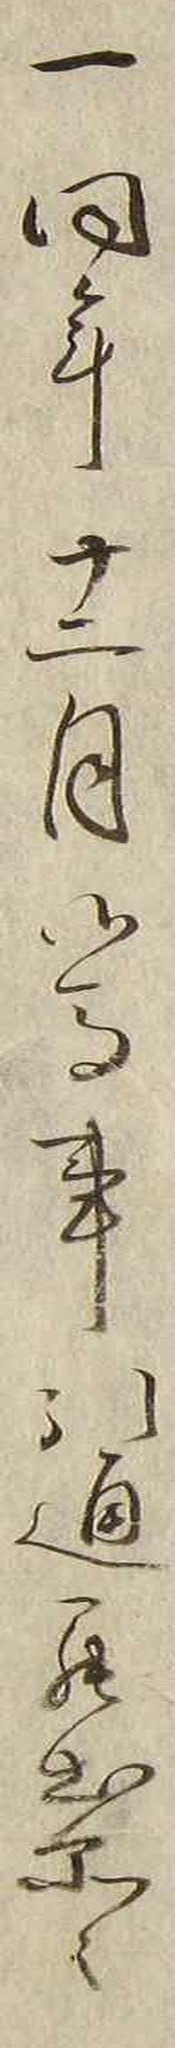一同年十二月御馬事引通罷出品々

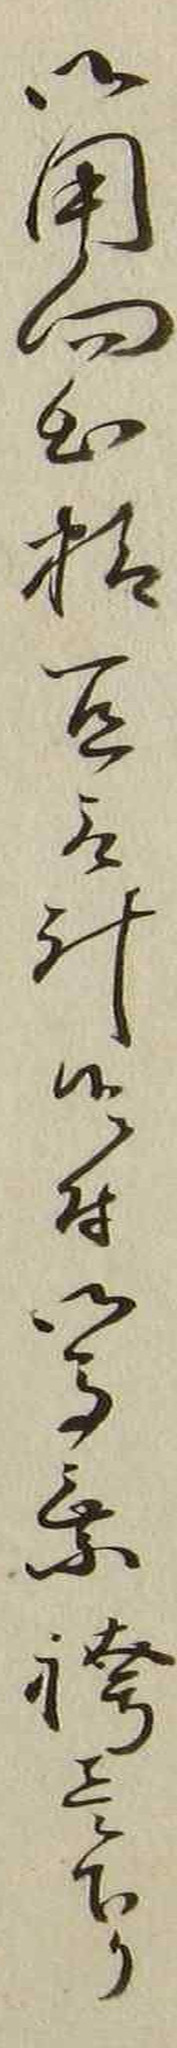御用向出精宜取計候ニ付御馬乗袴壱下り
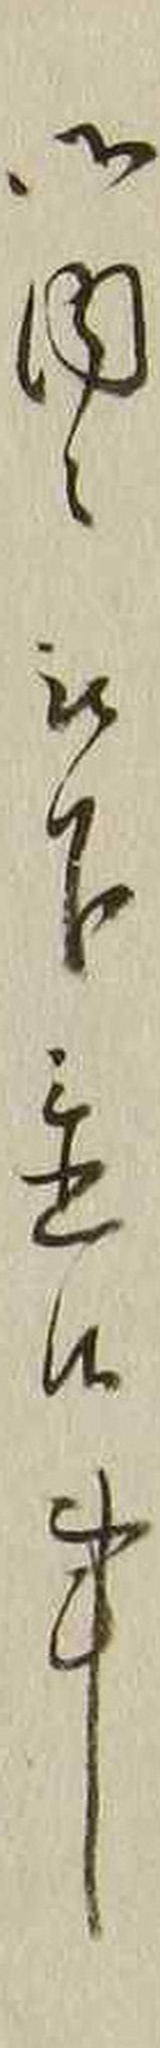御内々被下置候事
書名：諸士系譜　巻之25　い之部25
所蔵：会津若松市立会津図書館
